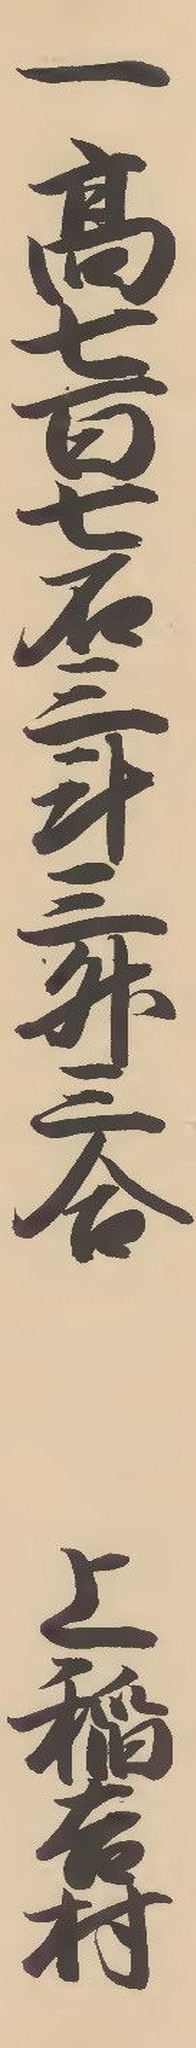一高七百七石三斗三升三合上稲吉村

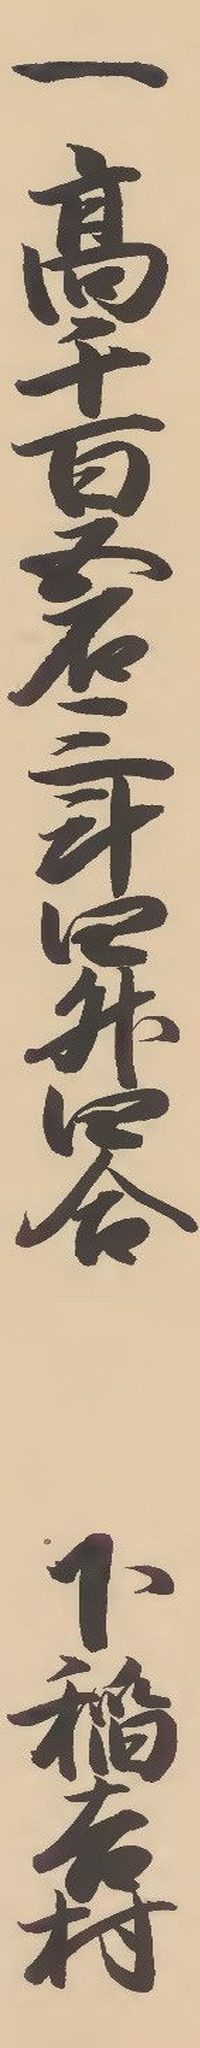一高千百五石三斗四升四合下稲吉村
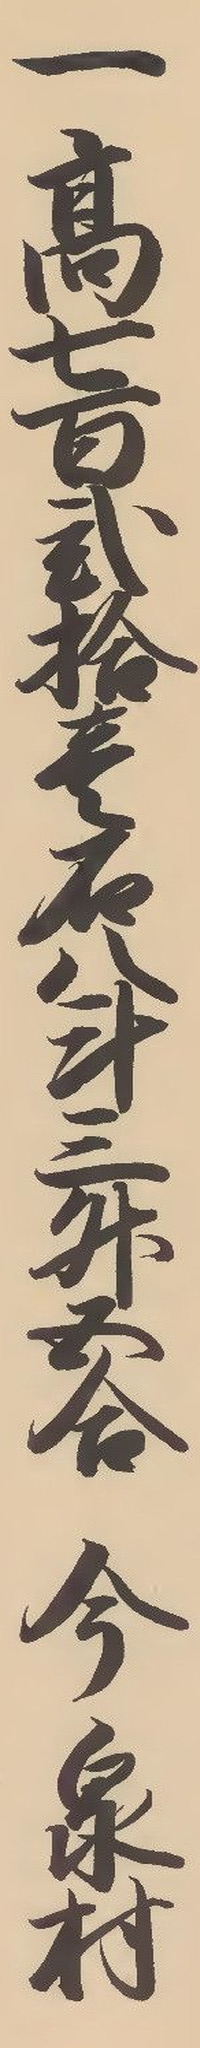一高七百弐拾壱石八斗三升五合今泉村
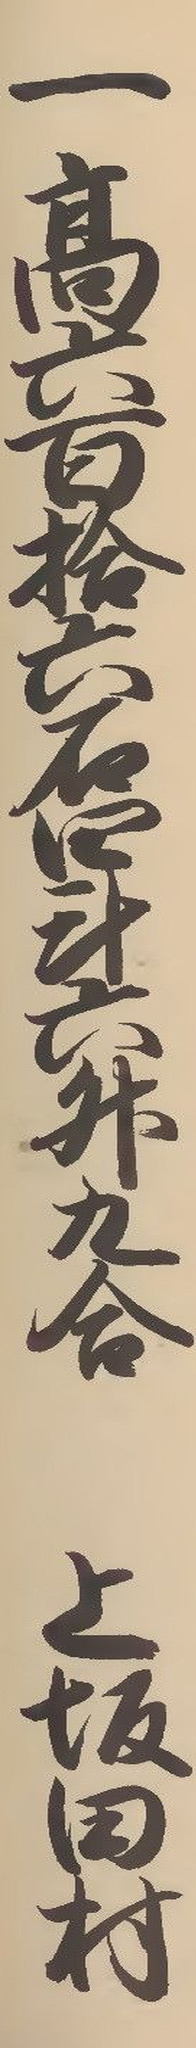一高六百拾六石四斗六升九合上坂田村
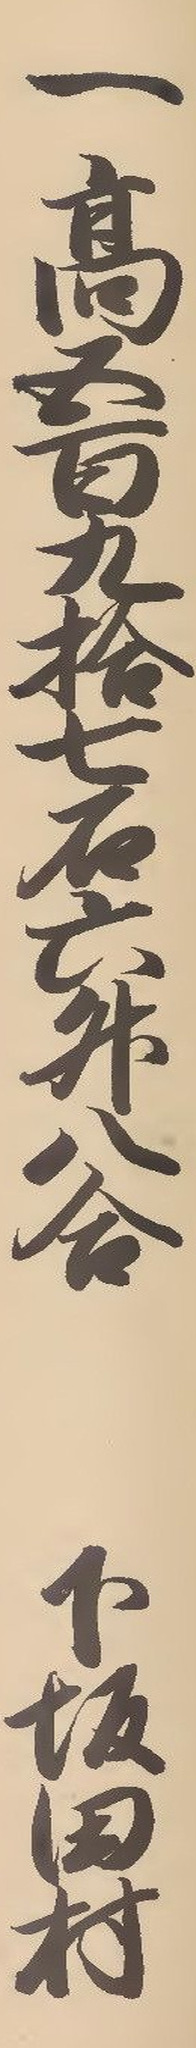一高五百九拾七石六升八合下坂田村
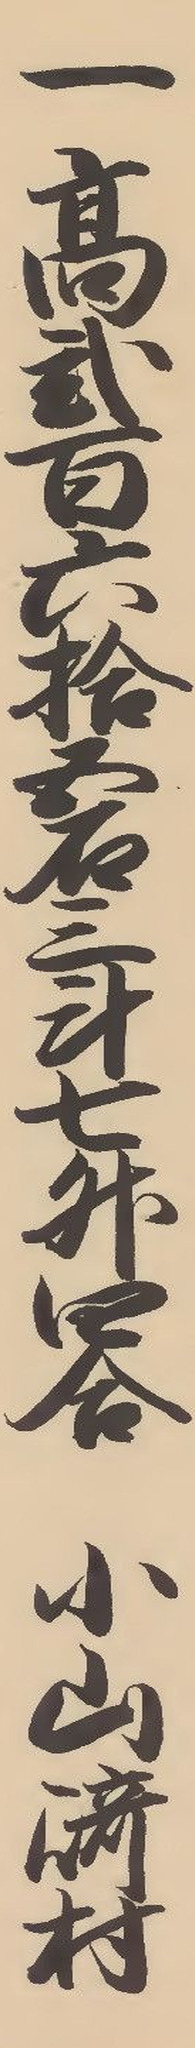一高弐百六拾五石三斗七升四合小山崎村
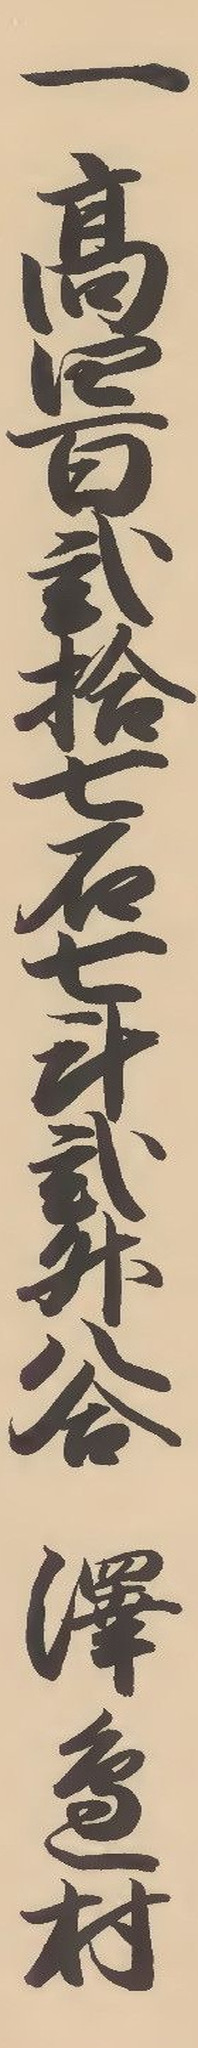一高四百弐拾七石七斗弐升八合沢辺村
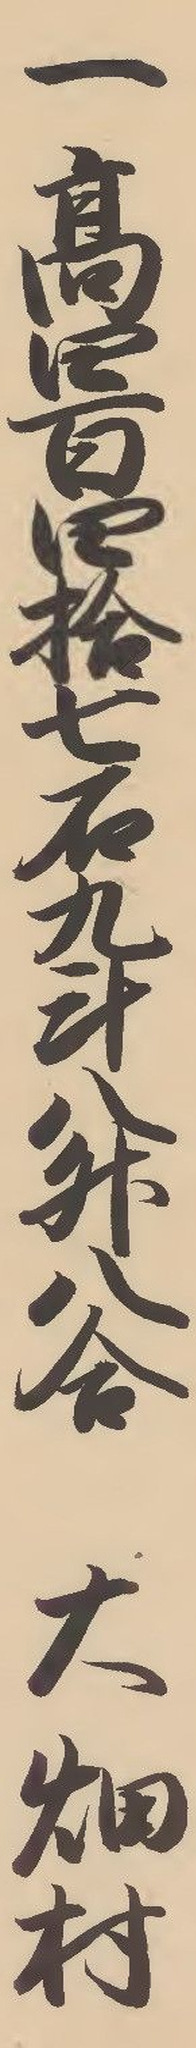一高四百四拾七石九斗八升八合大畑村

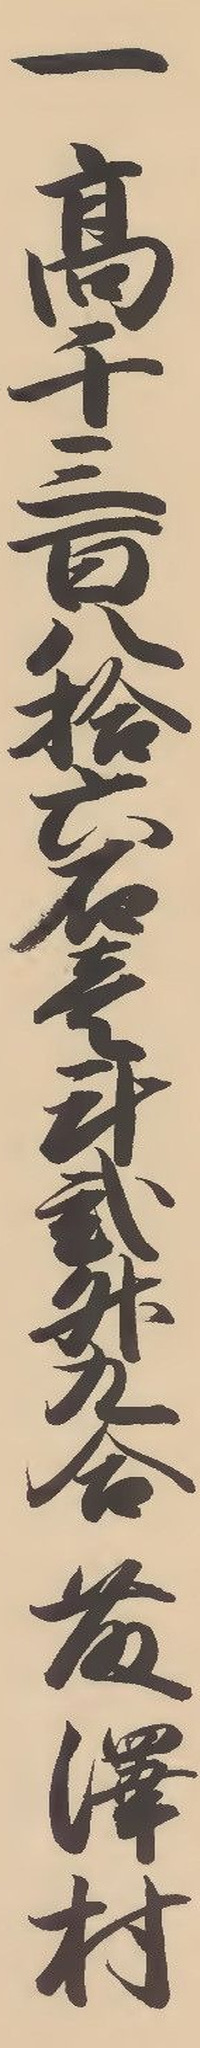一高千三百八拾六石壱斗弐升九合藤沢村
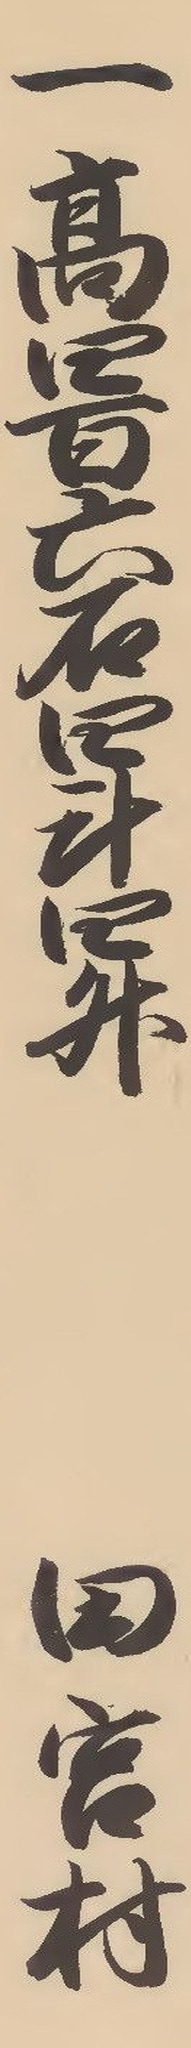一高四百六石四斗四升田宮村
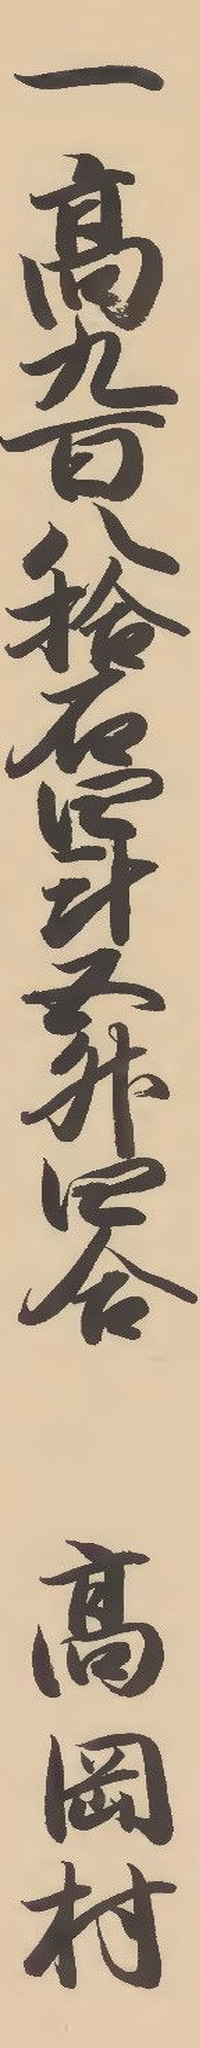一高九百八拾石四斗五升四合高岡村
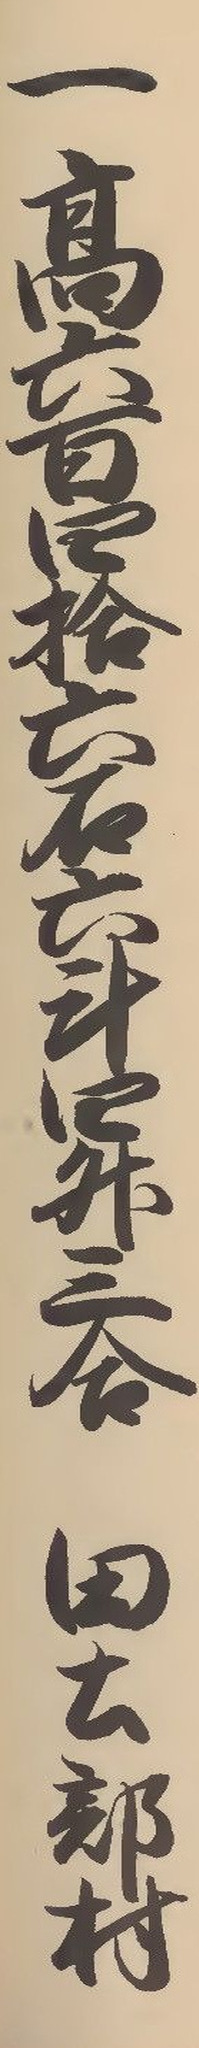一高六百四拾六石六斗四升三合田土部村
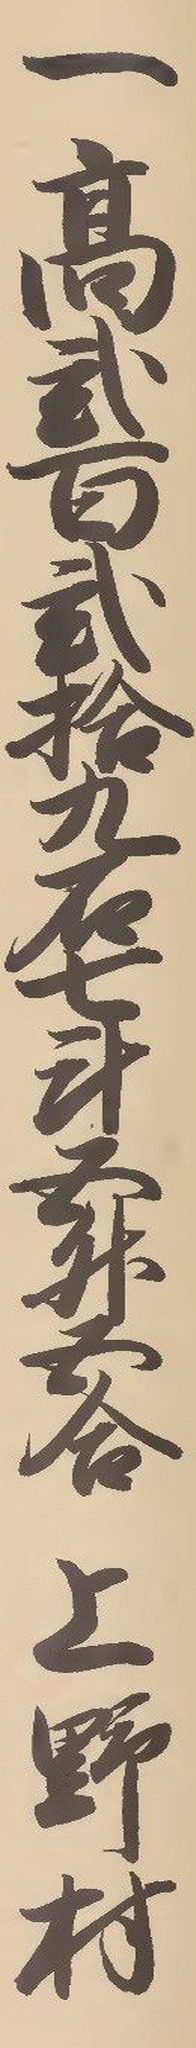一高弐百弐拾九石七斗五升五合上野村
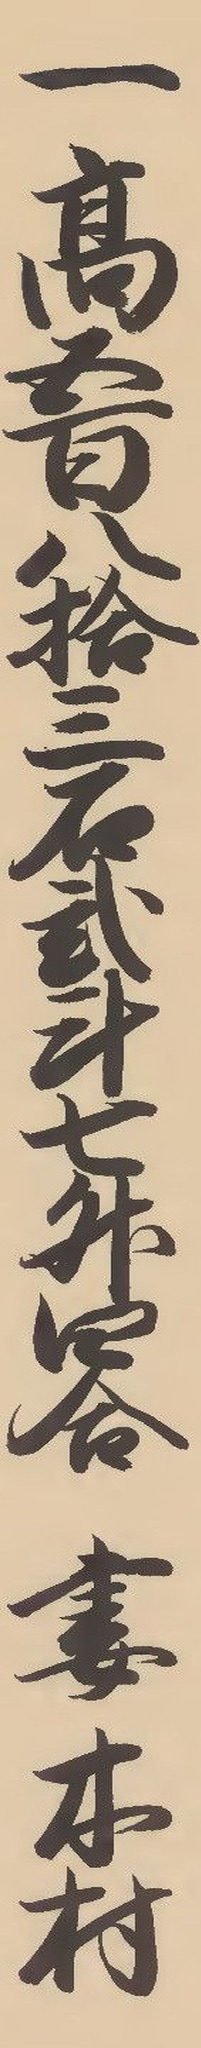一高五百八拾三石弐斗七升四合妻木村
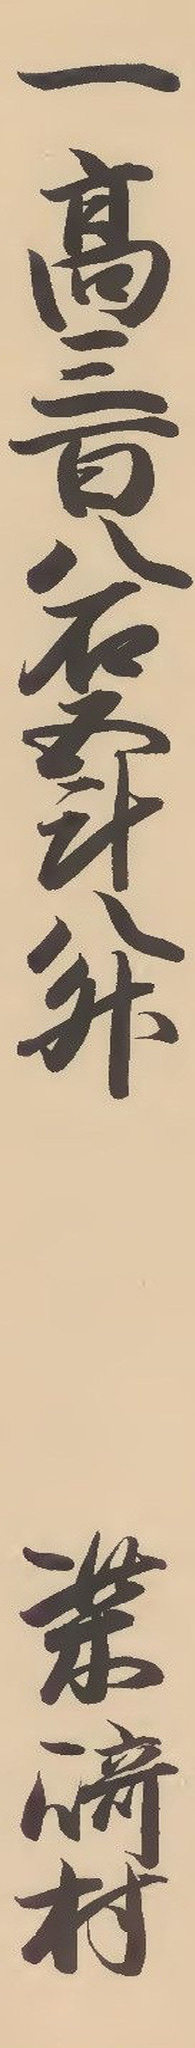一高三百八石五斗八升柴崎村
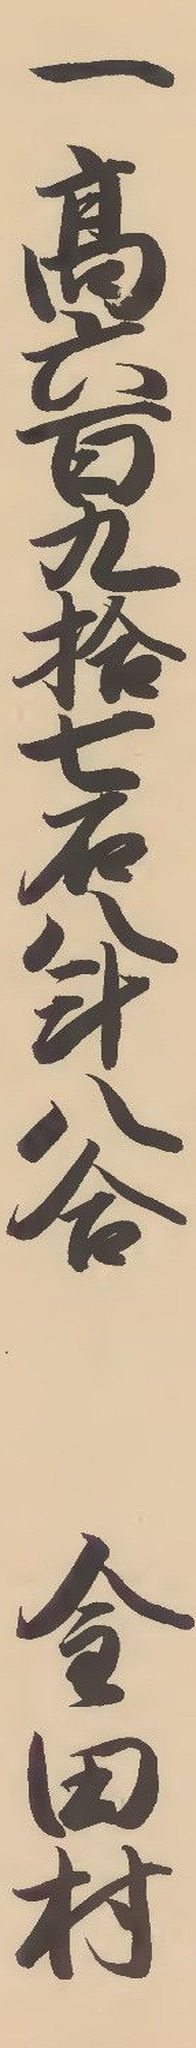一高六百九拾七石八斗八合金田村
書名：常陸国郷帳
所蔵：国立公文書館 National Archives of Japan
